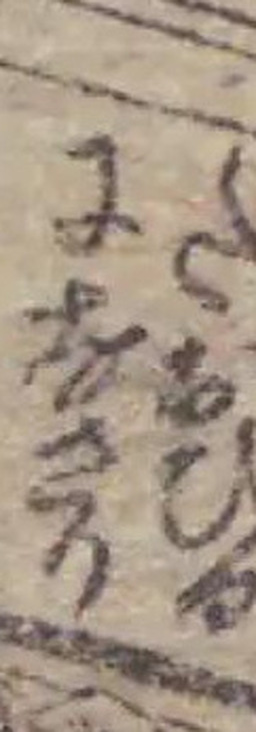になさり
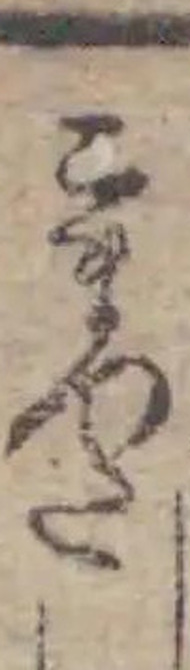こまつた

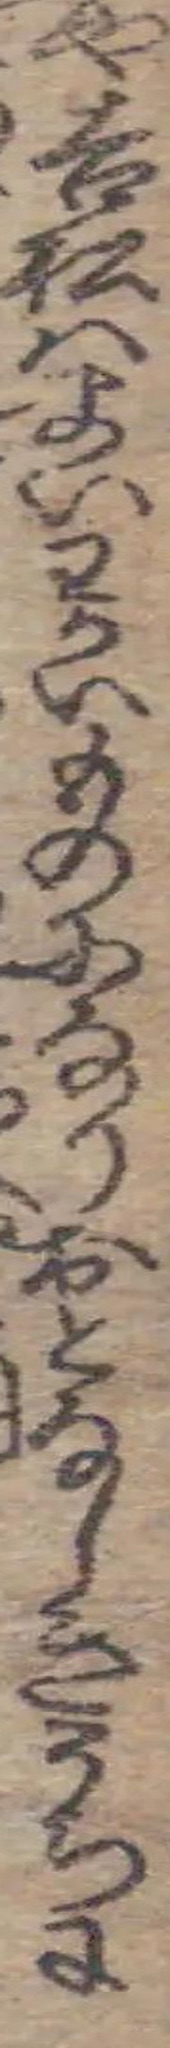もはや吉松はよいわかいものになりおとなしきうちに
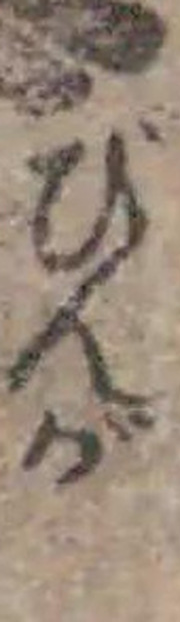びんが
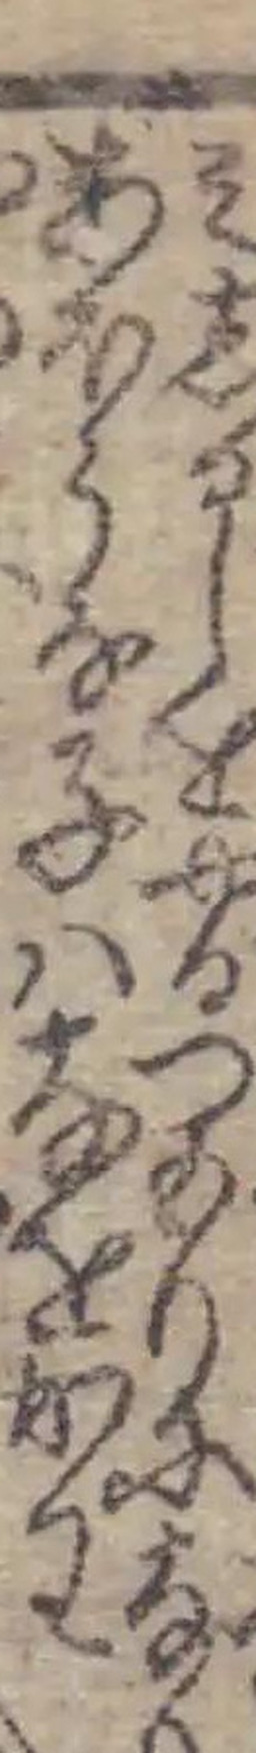あほうな子はなをかわ
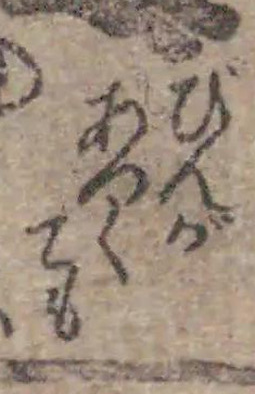あつく
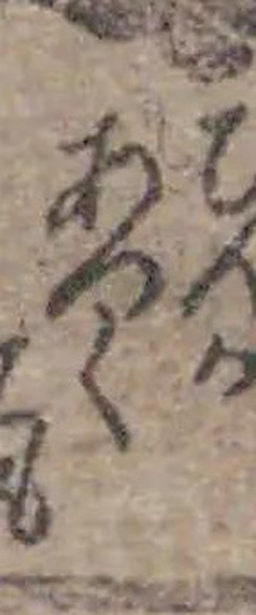あつく
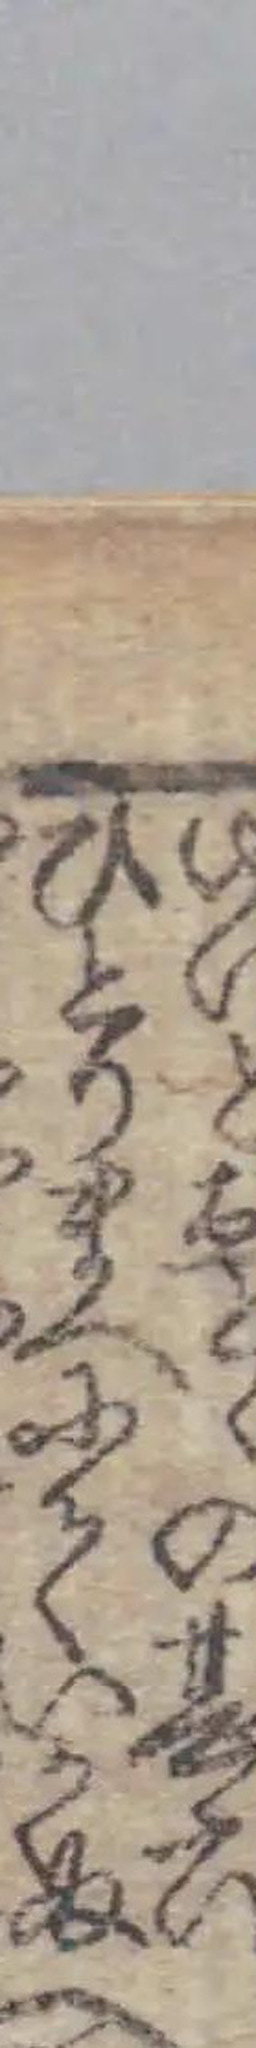ひとりまへにていかぬ
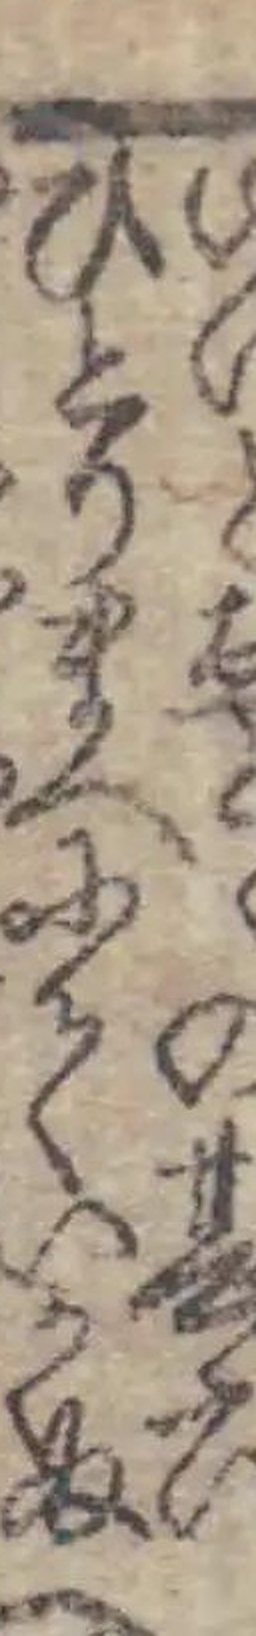ひとりまへにていかぬ
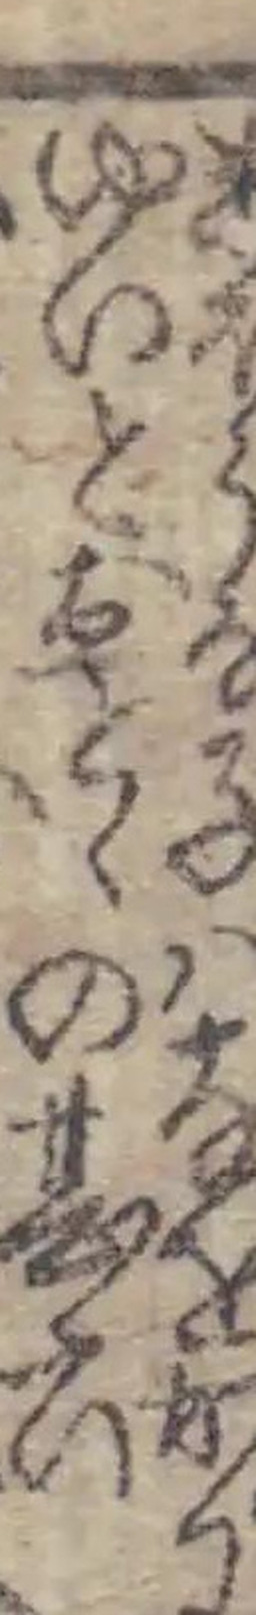ゆいとおとゝの甚六
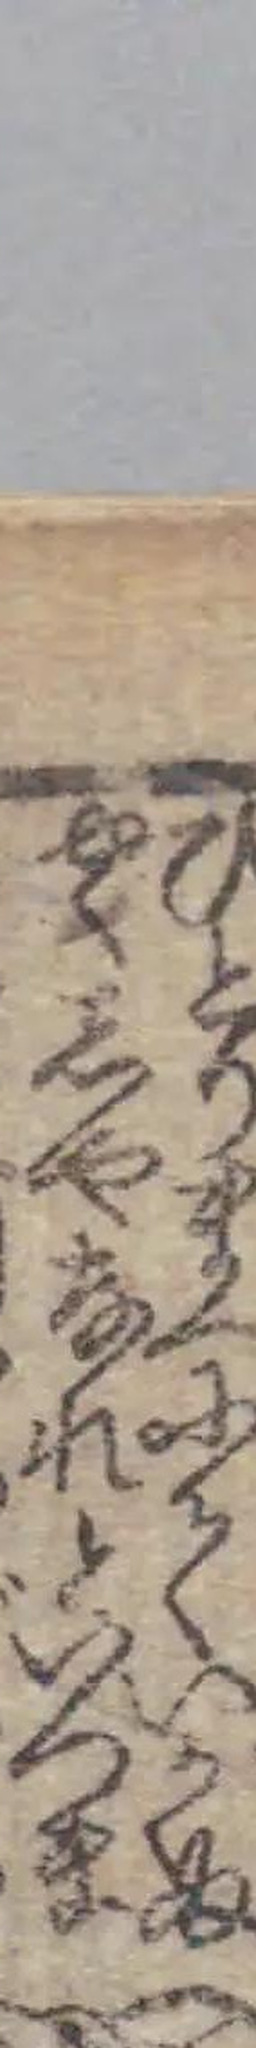やくしやなれといつま
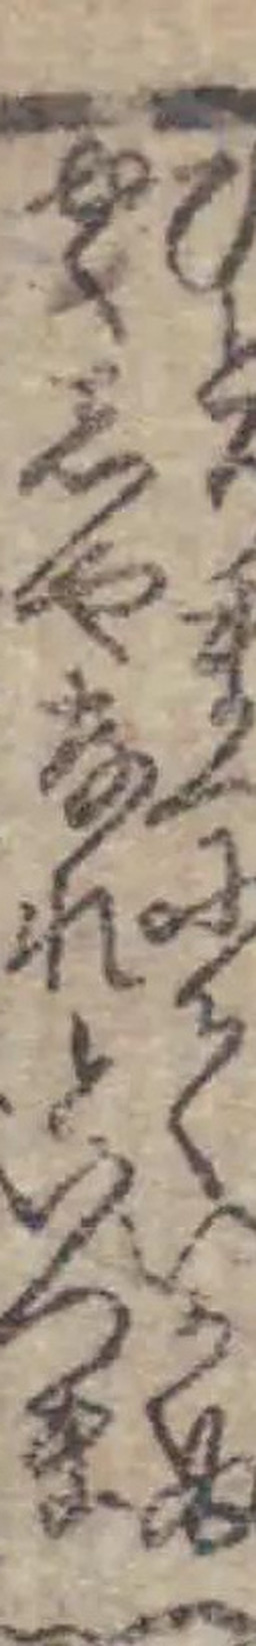やくしやなれといつま
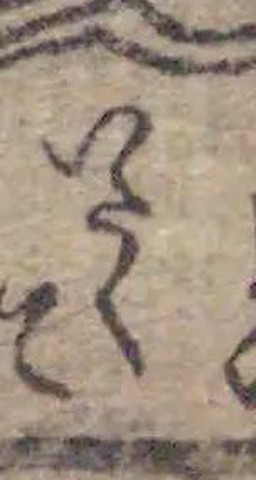いたく
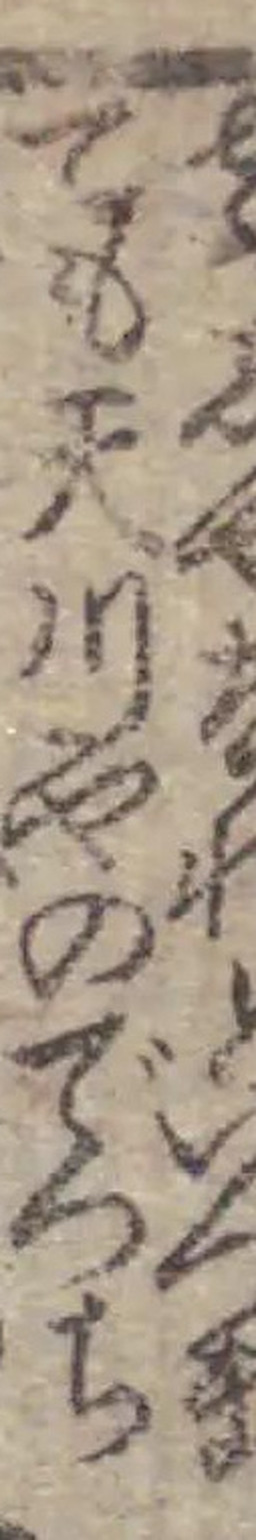ても天川やのでつち
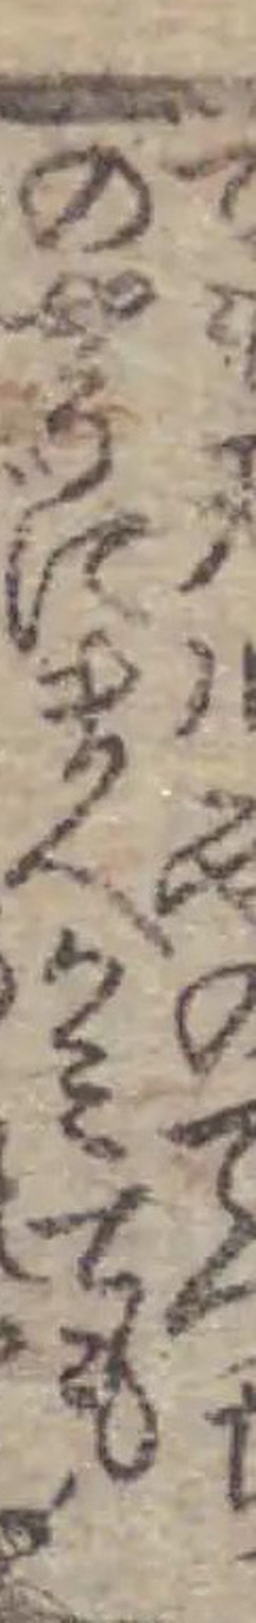のやうにまへかみても
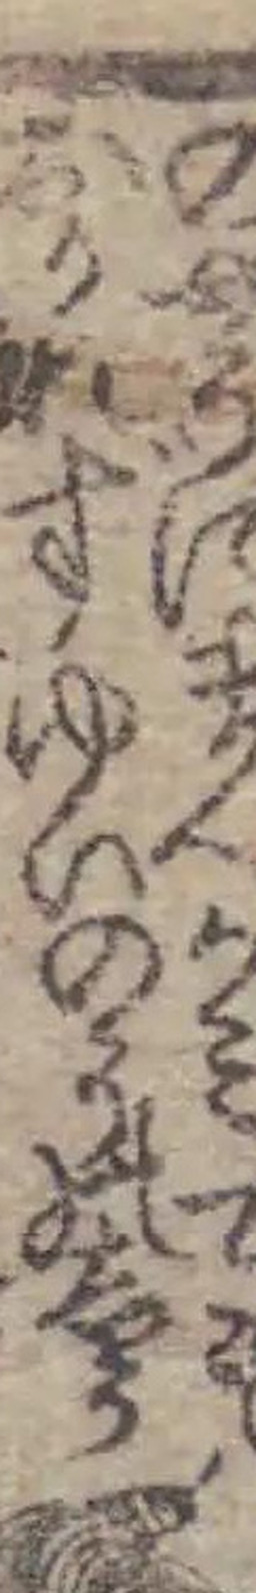おかれずゆいのうのしう
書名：津以曽無弟の甚六 3巻
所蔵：国立国会図書館 National Diet Library, JAPAN
